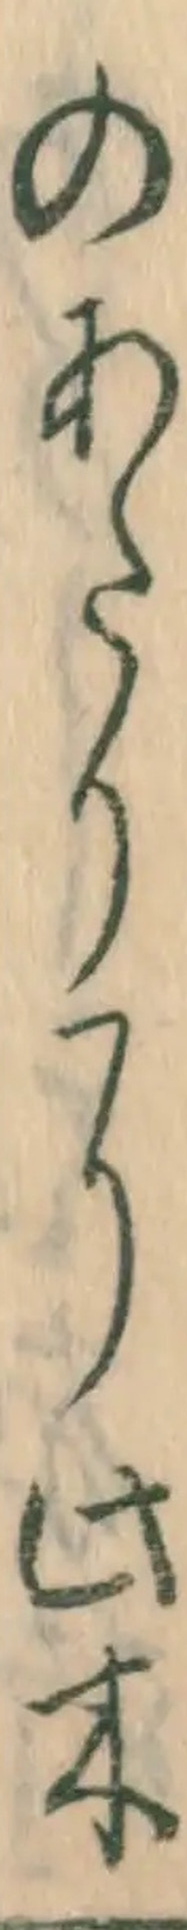のあたりに此木
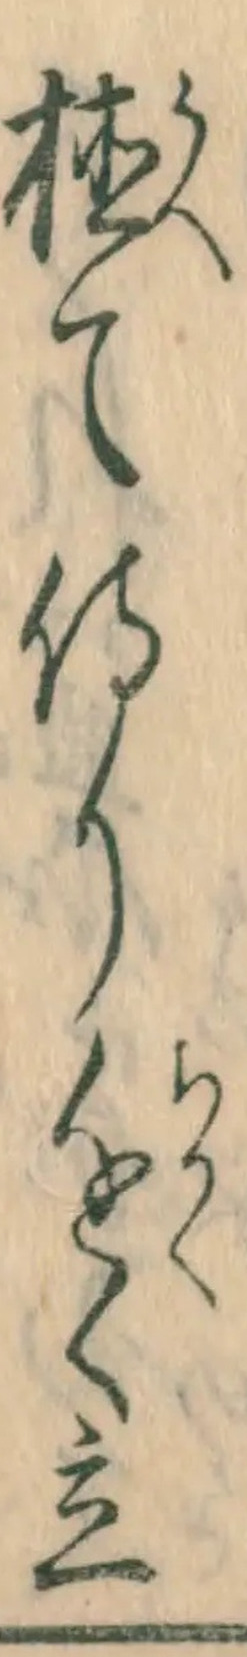植て侍り近く立
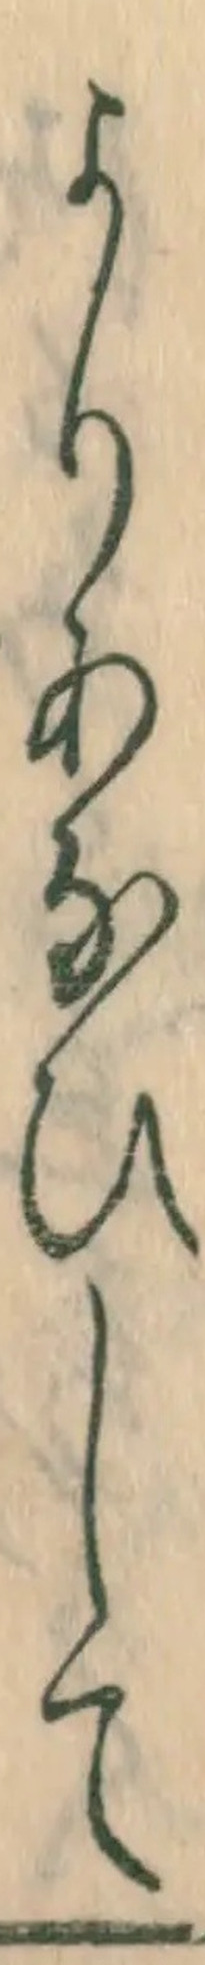よりあなひして
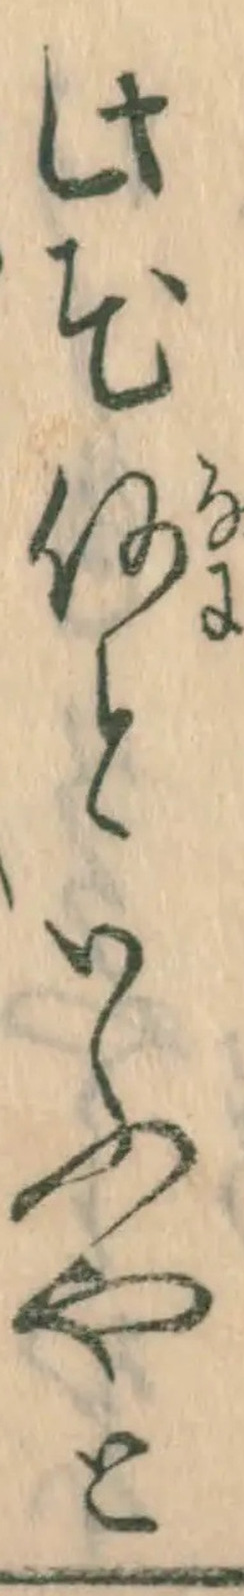此花何といふやと
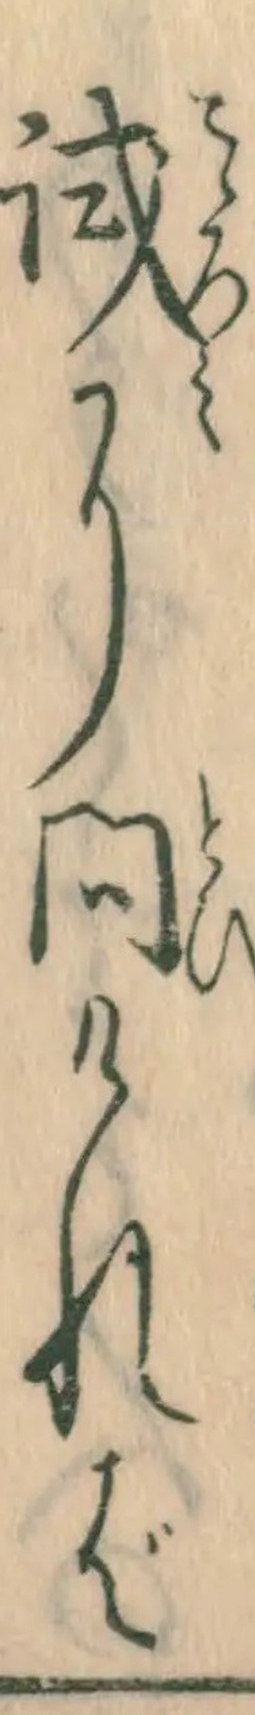試に問ければ
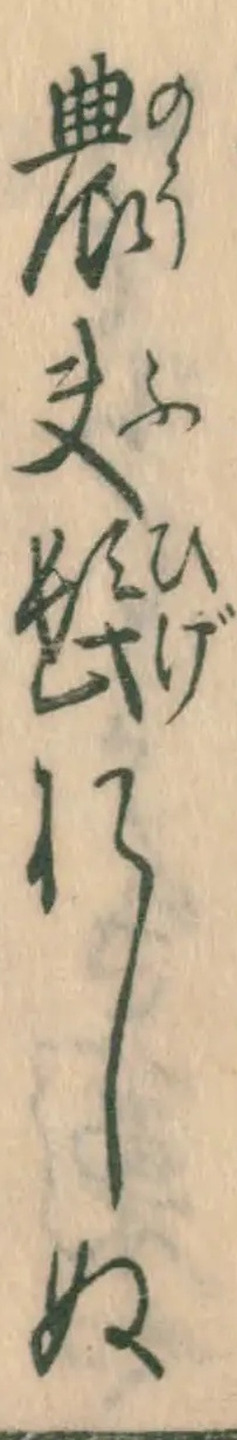農夫髭おしぬ
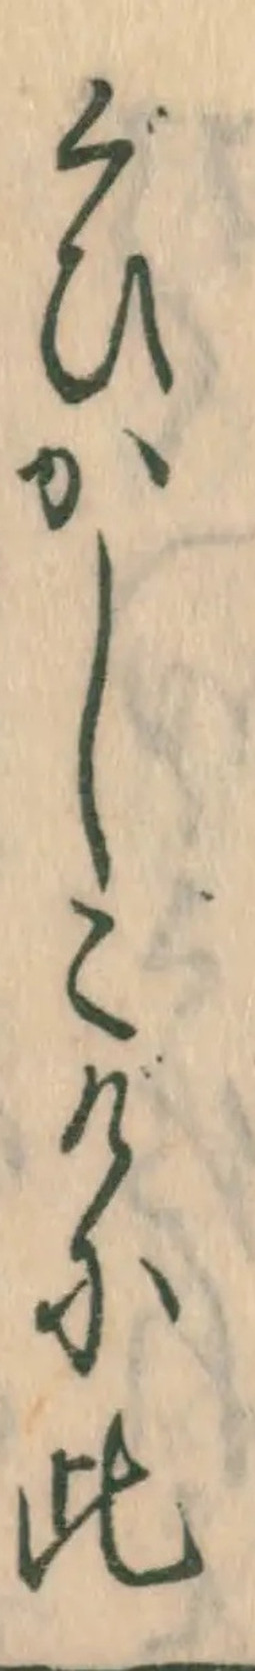ぐひかしこげに此
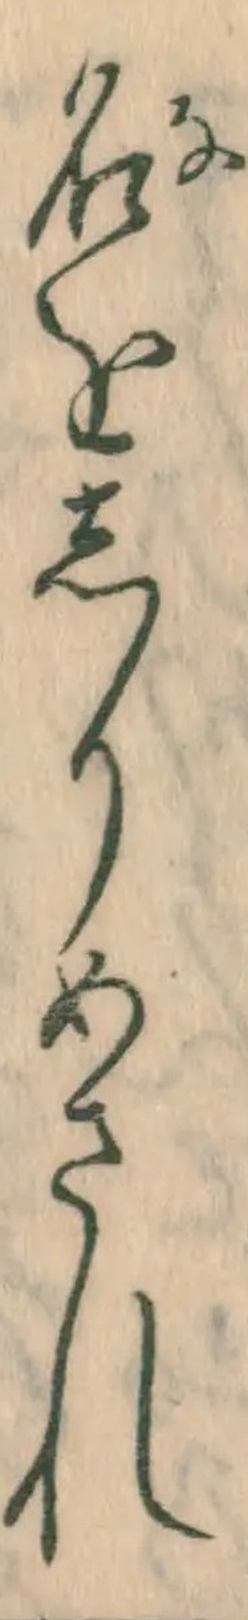名をしりめされ
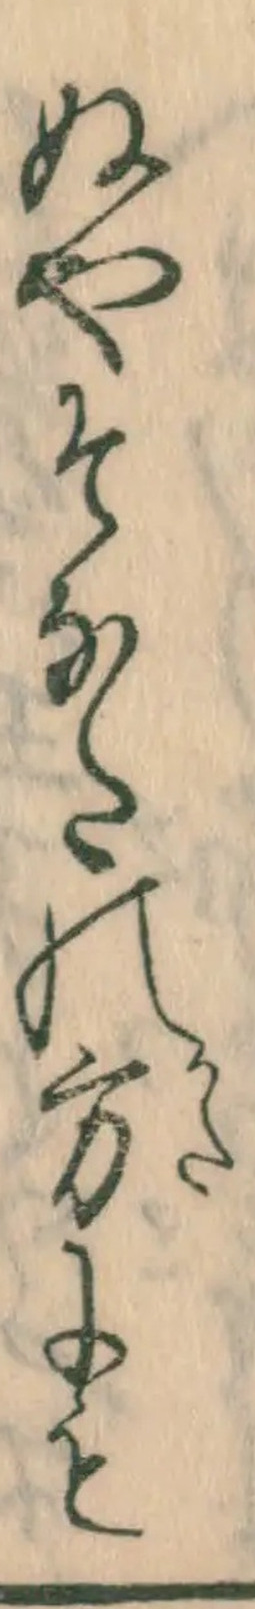ぬやそなたの方にも
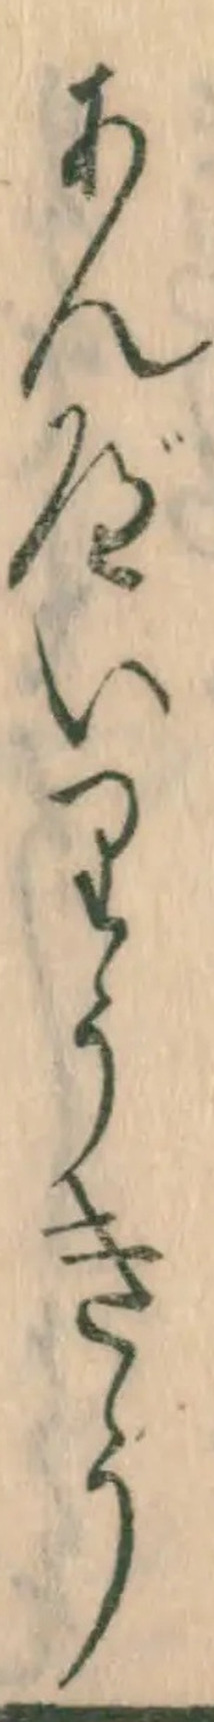あんべいりうきう
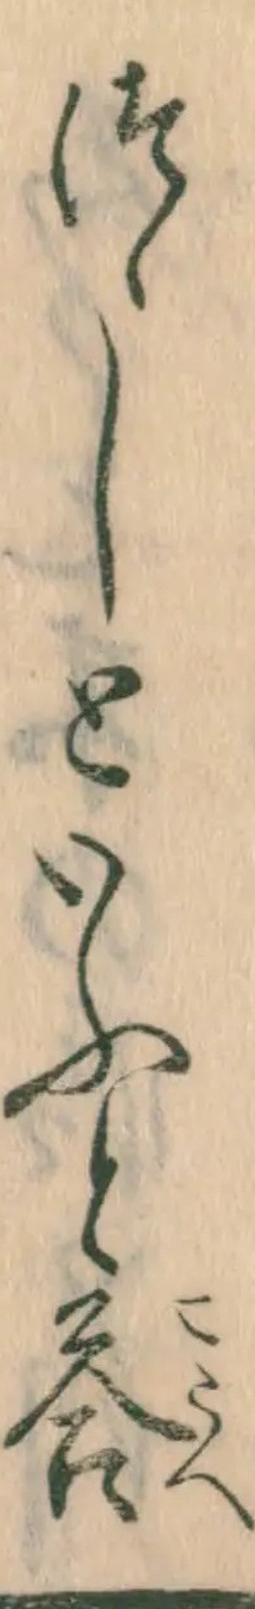つゝしといふと答
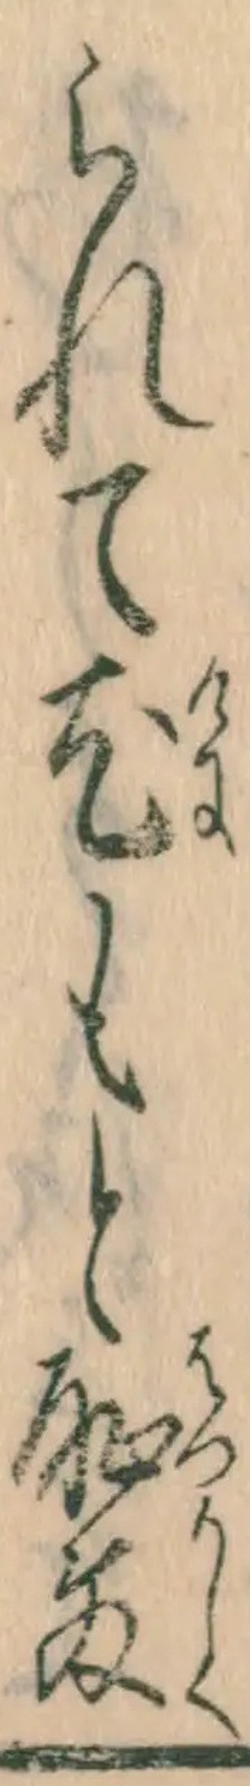られて尤もと恥敷
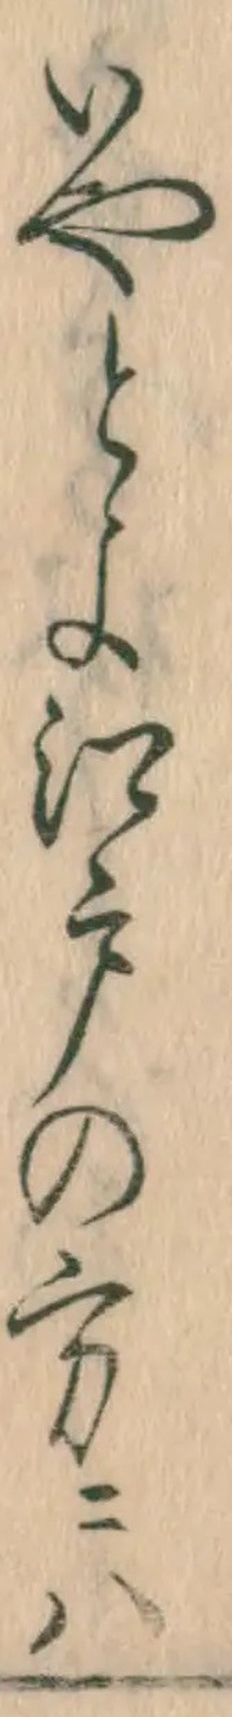いやとよ江戸の方には
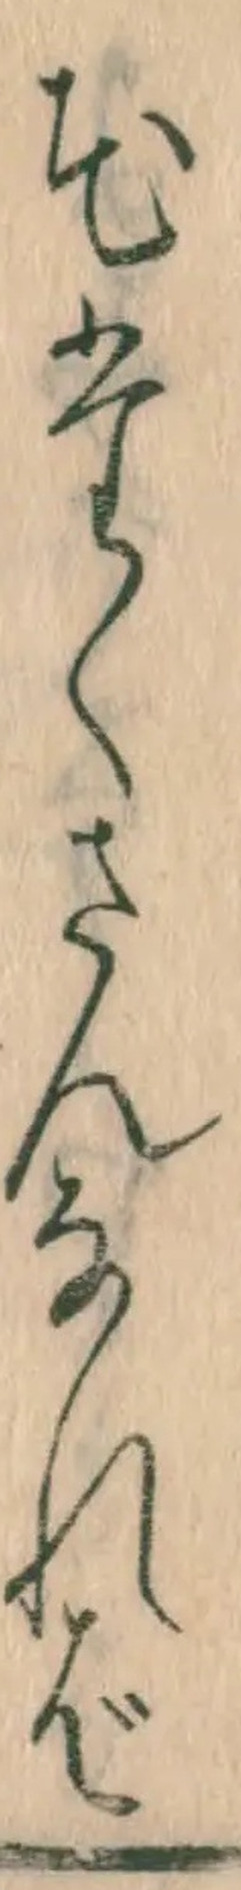花たくさんなれば
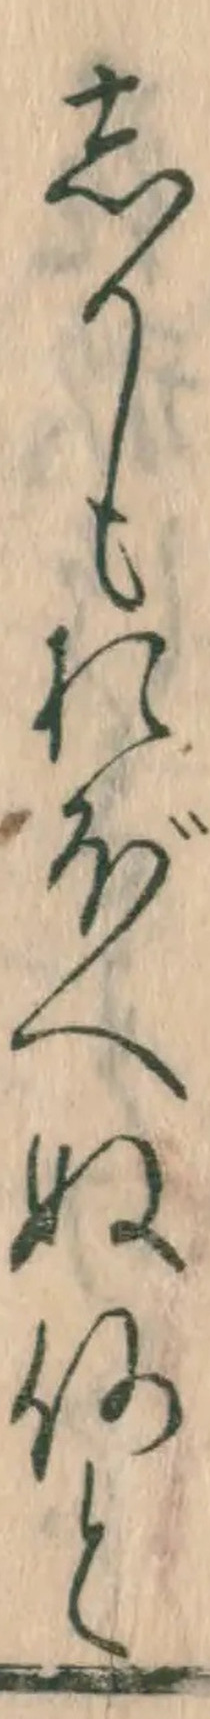しりもおぼへぬ何と
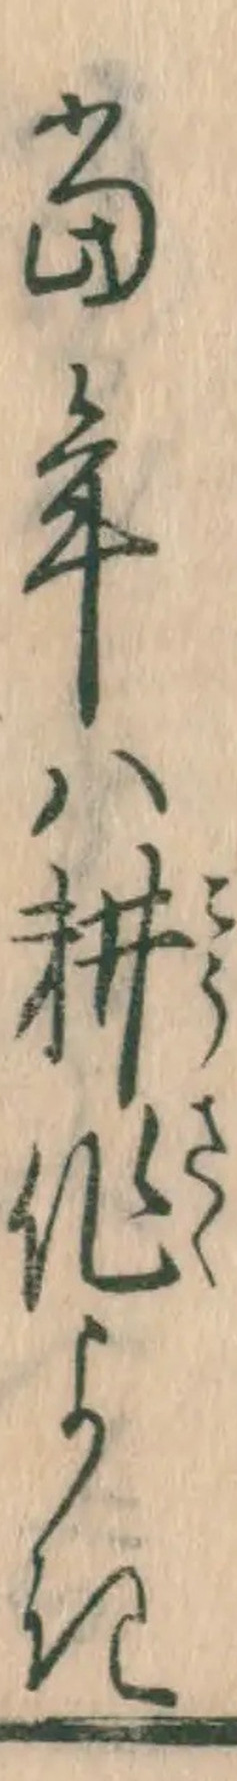当年は耕作よき
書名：錦繍枕 5巻. [1]
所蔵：国立国会図書館 National Diet Library, JAPAN
